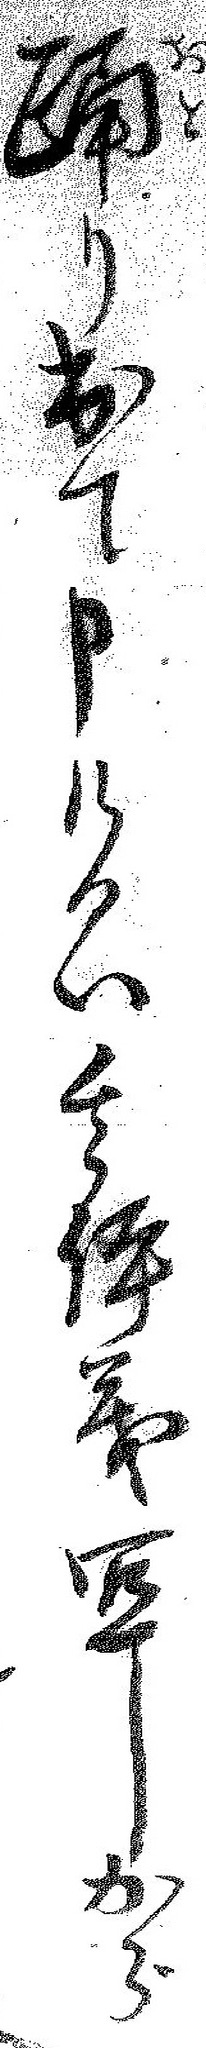踊り出て申けるは其評義宜しから
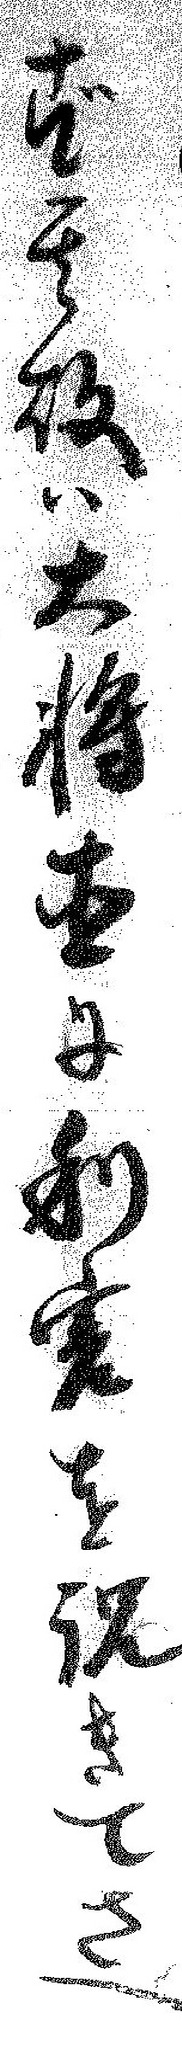ず其故は大将直に利害を説きてさへ
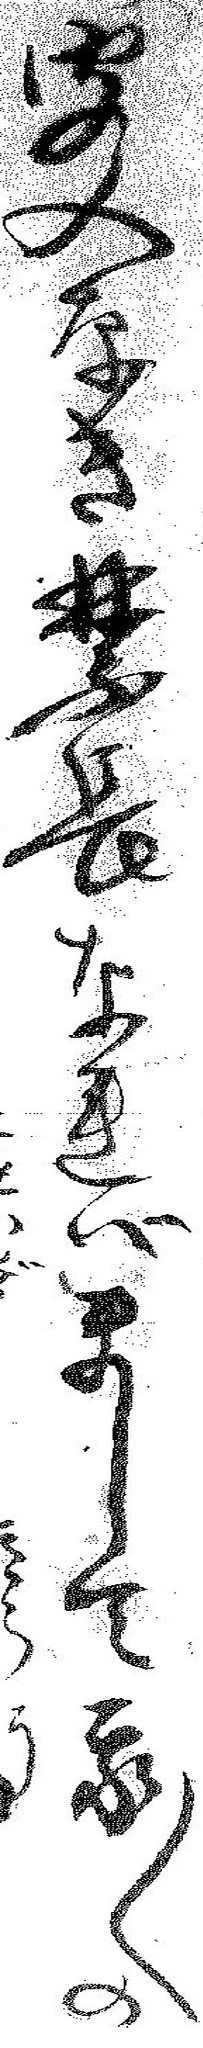聞入なき禁長なればまして我〳〵の
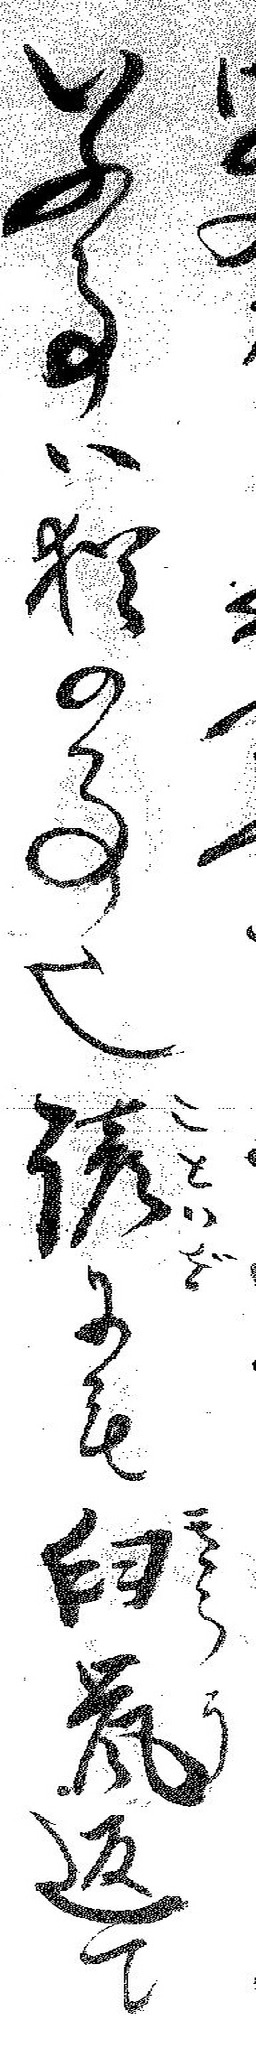いふ事は猶の事也諺にも臼鼠返て
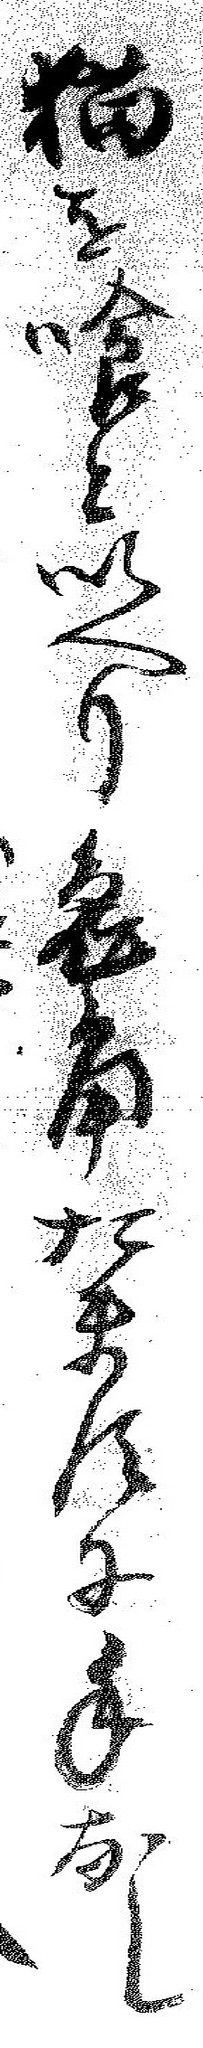猫を喰といへり兎角たますに手なし
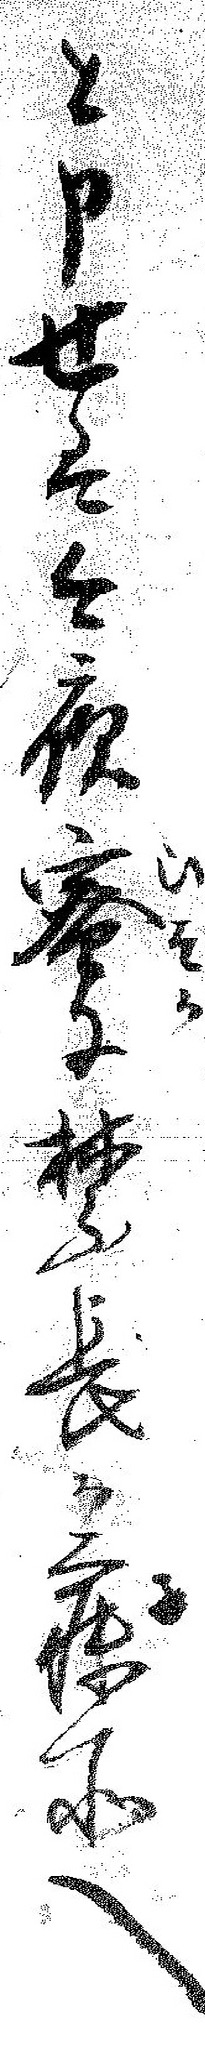と申せは今夜密に禁長か寝所へ
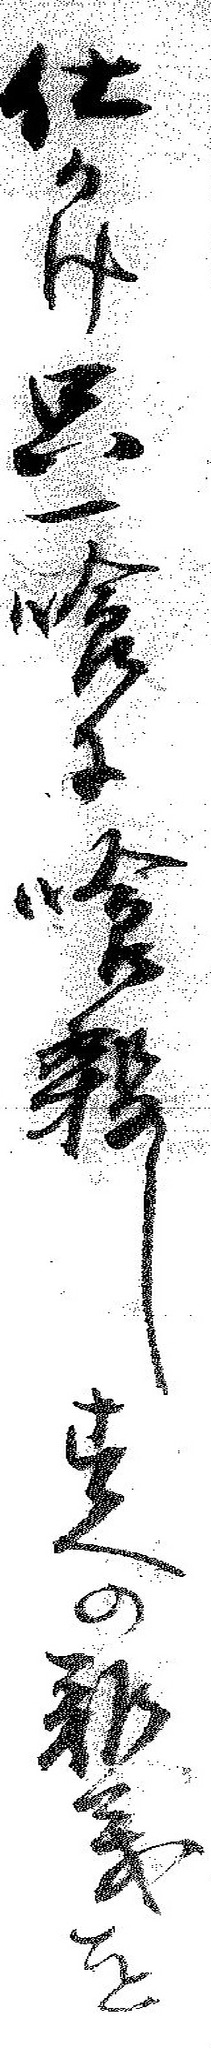仕かけ只一喰に喰殺しすへの難義を
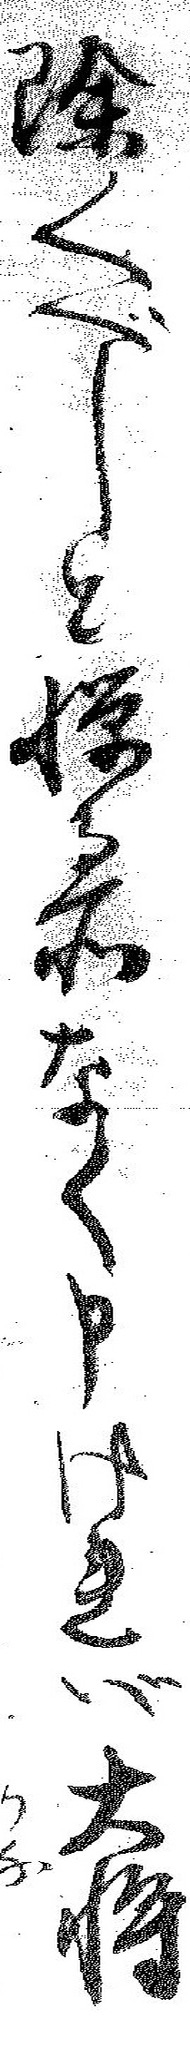除くべしと憚る所なく申ければ大将
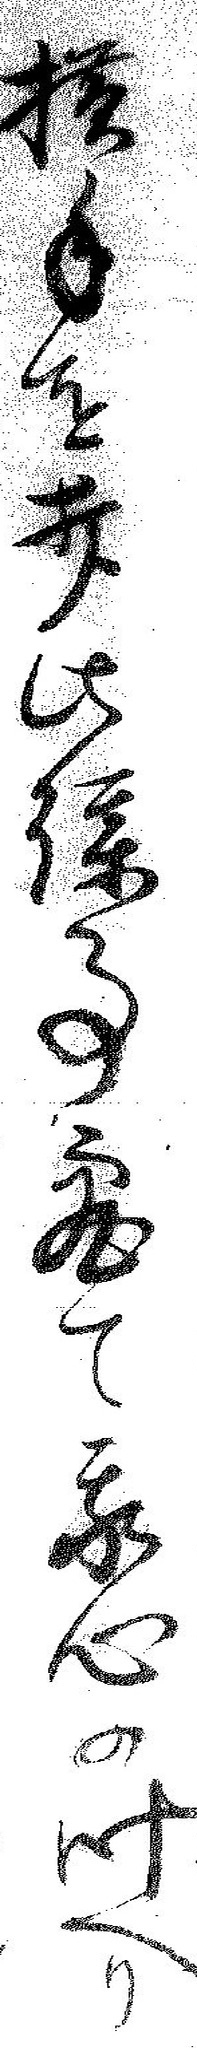横手を打此謀事究て我心の叶へり
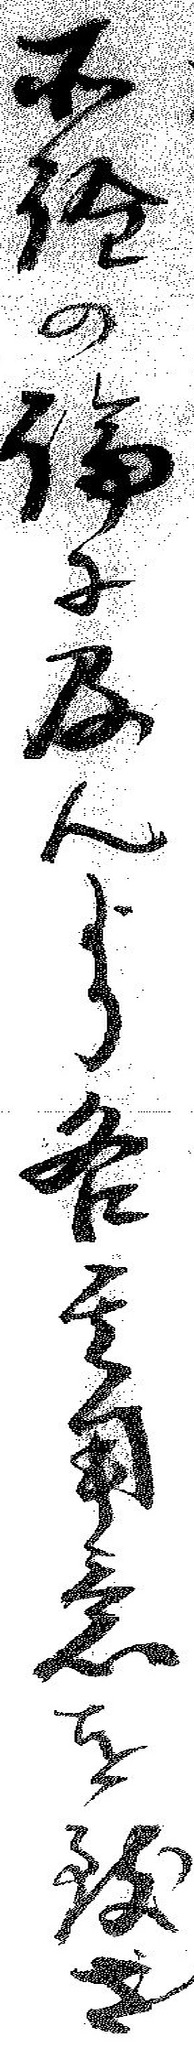所詮の論に及んより各其用意を致さ
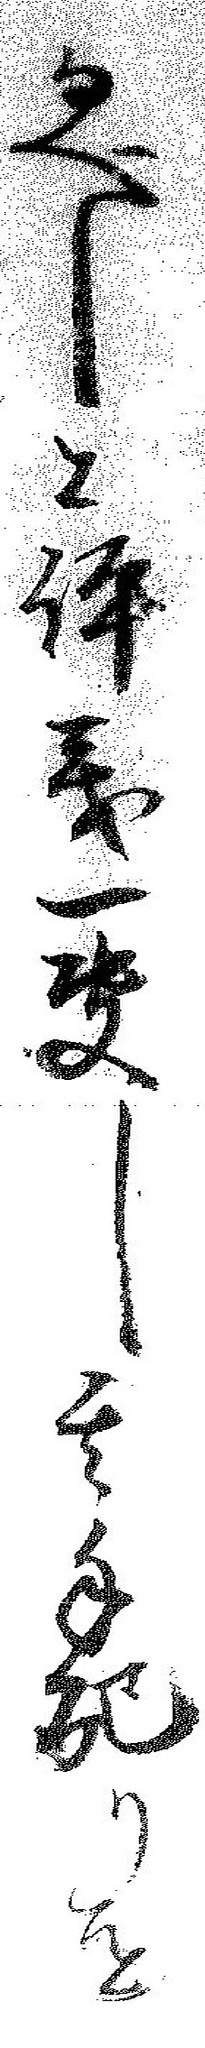るべしと評義一決し其手配りを
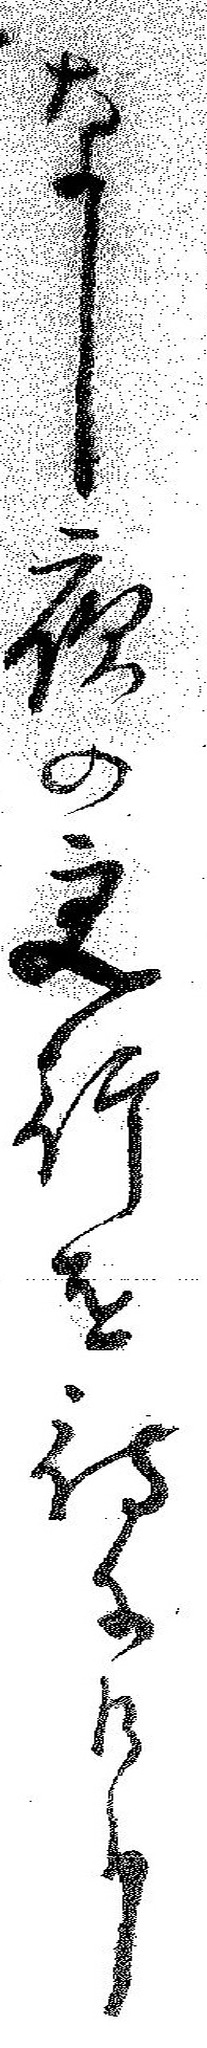なし夜の更行を待にけり
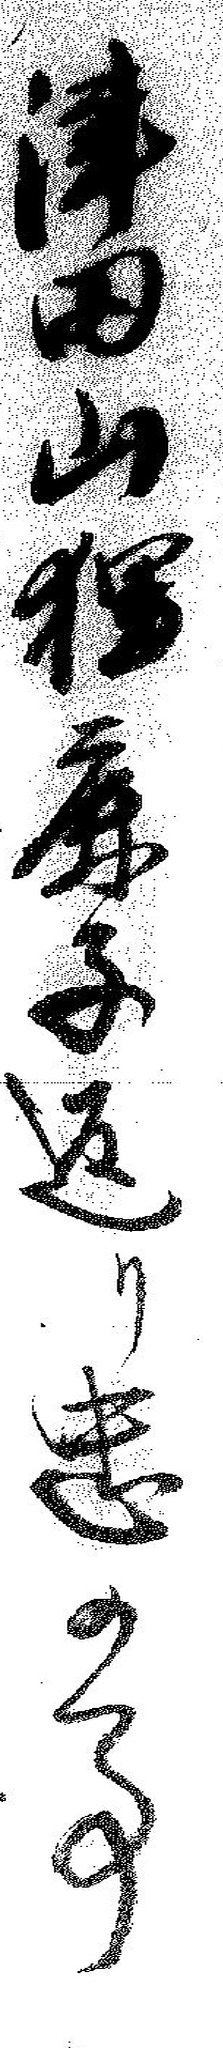津田山狸鹿子返り忠の事
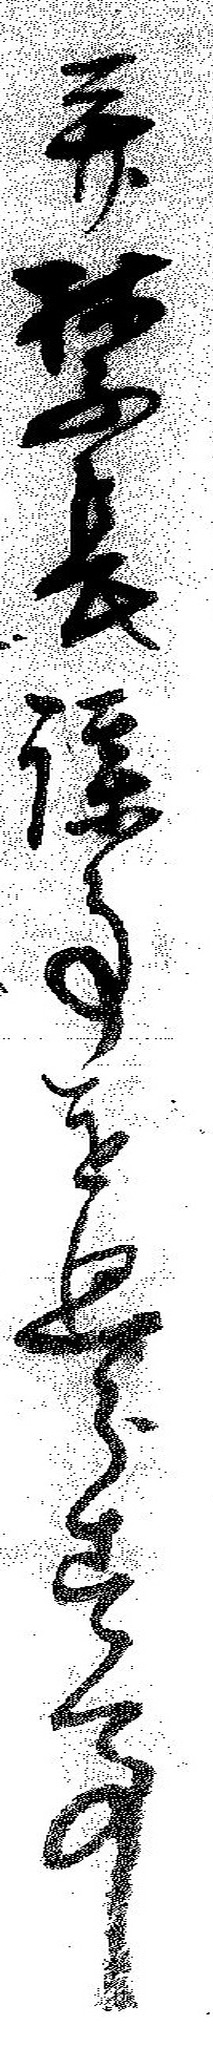幷禁長謀事を廻らす事
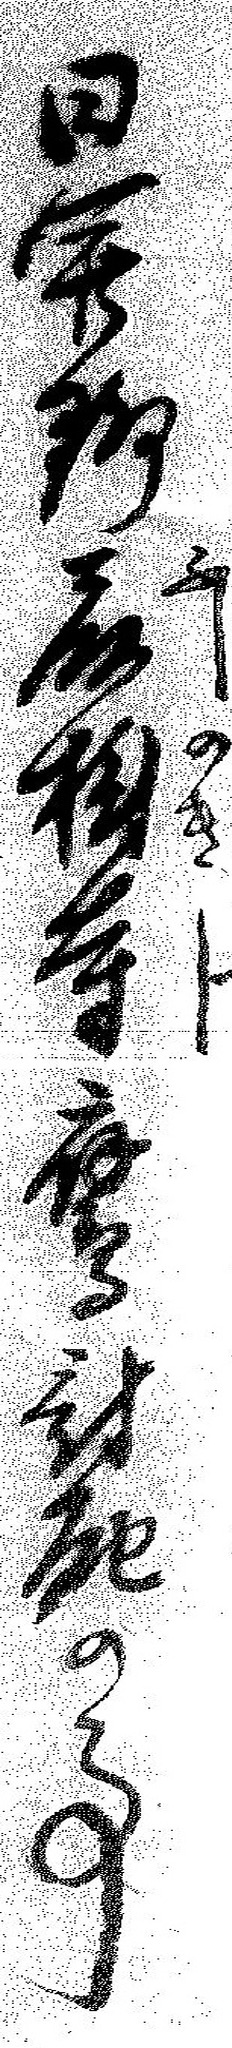日開野藤樹寺鷹討死の事

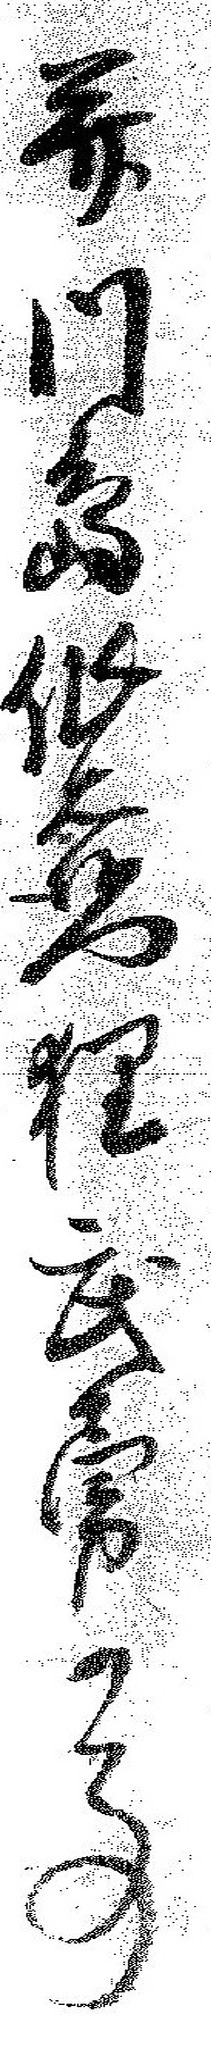幷川島作右衛門狸武勇の事
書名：近頃古狸珍説　礼義智信
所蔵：徳島県立図書館
